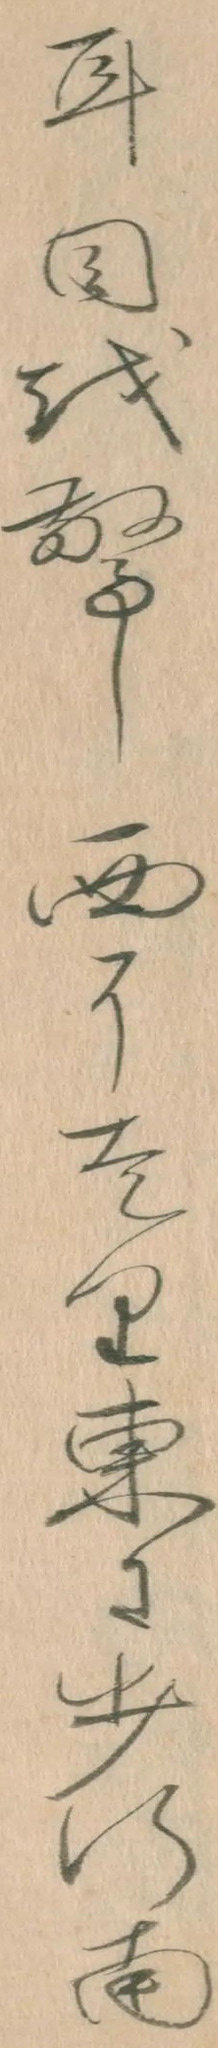耳目を驚し西に走り東に歩行南
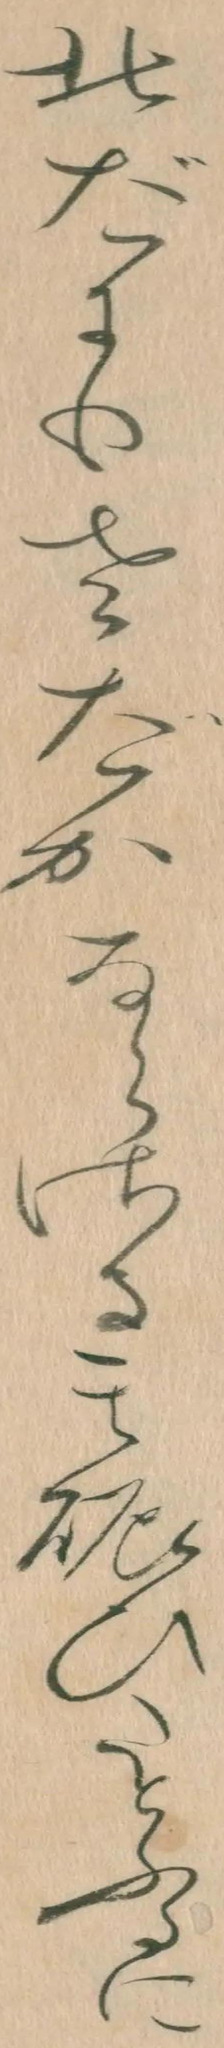北だにもさだかならさる其賑ひたとふるに
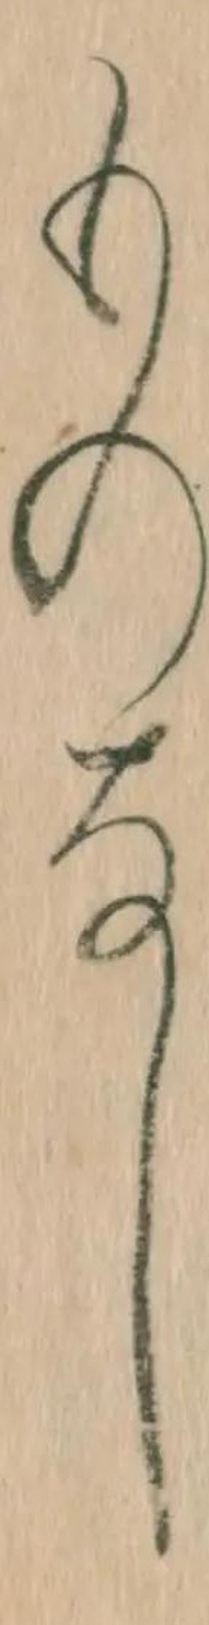ものなし
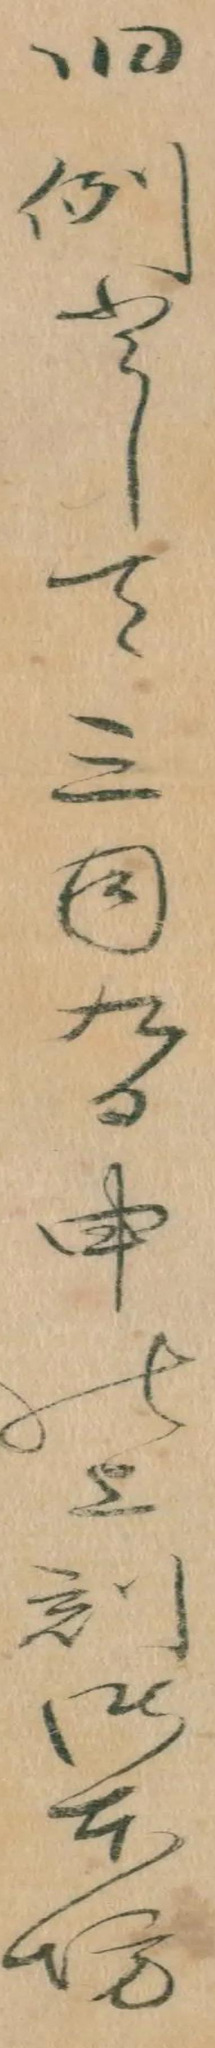旧例として三月九日申の上刻御本坊
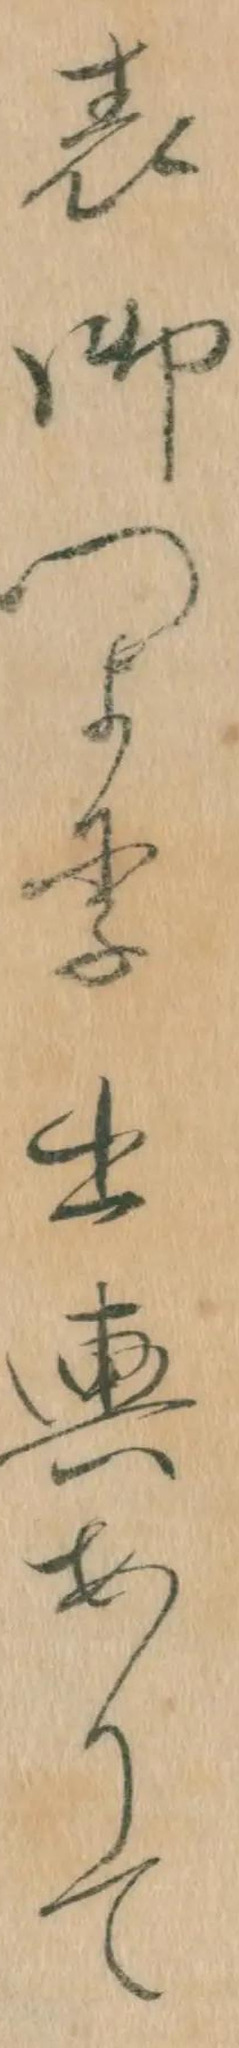表御門より出輿ありて
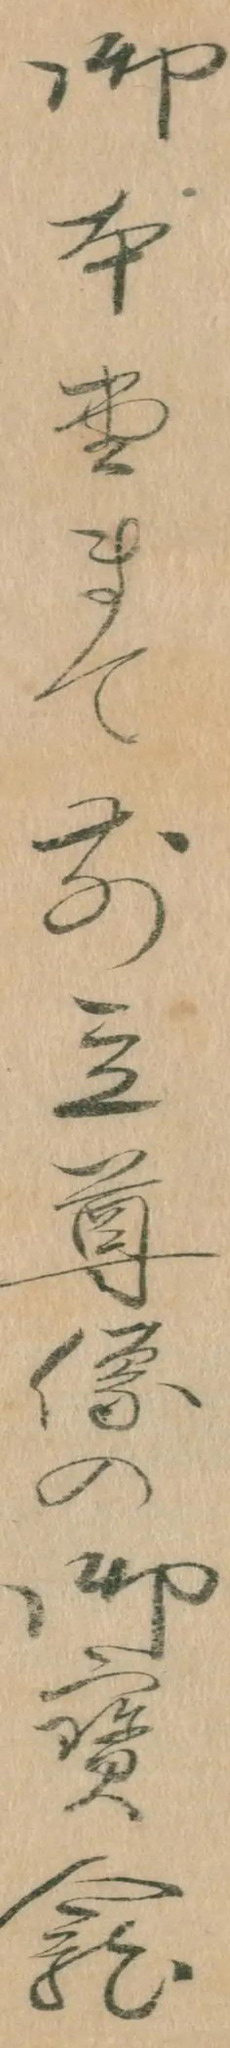御本堂まて前立尊像の御寶龕
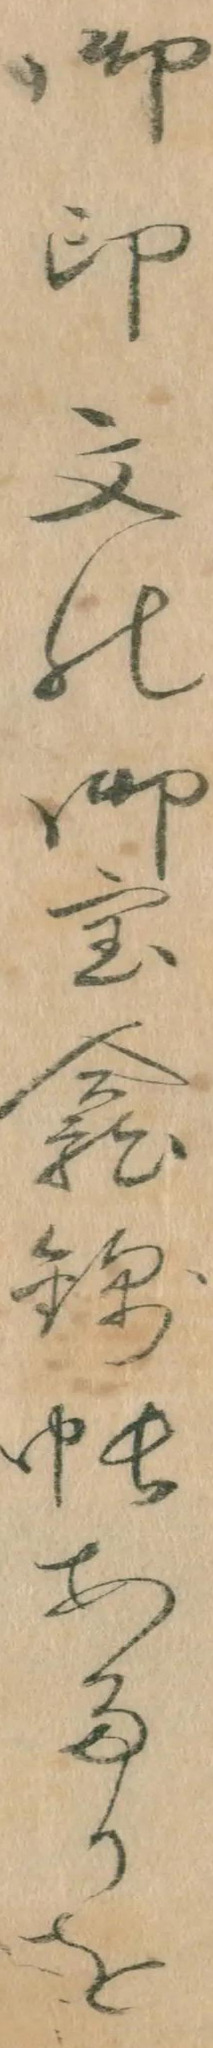御印文の御宝龕錦帳あたりを
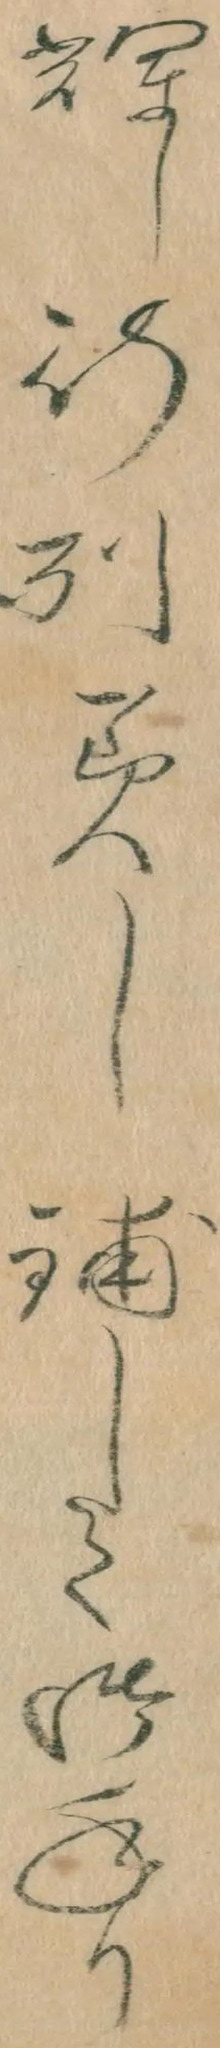輝し行列美し鋪して御ねり
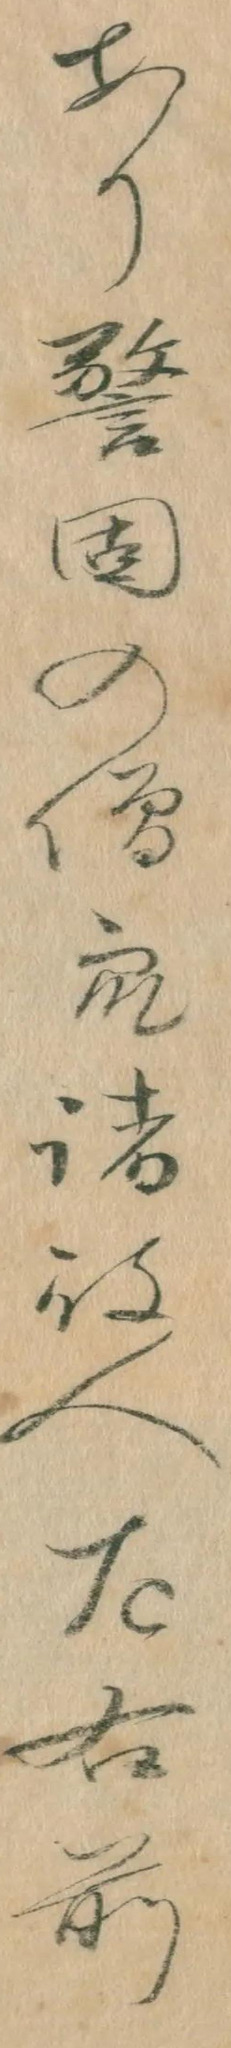あり警固の僧衆諸役人左右前
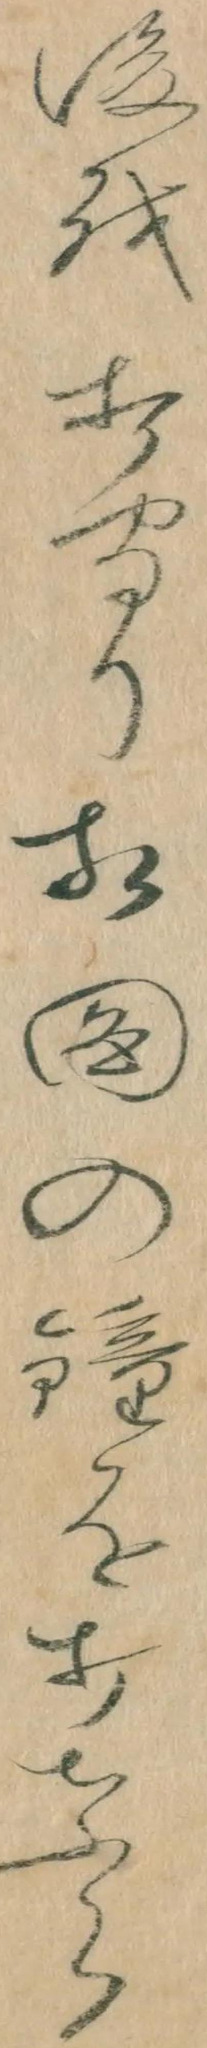後を打守り相図の鐘を打なら
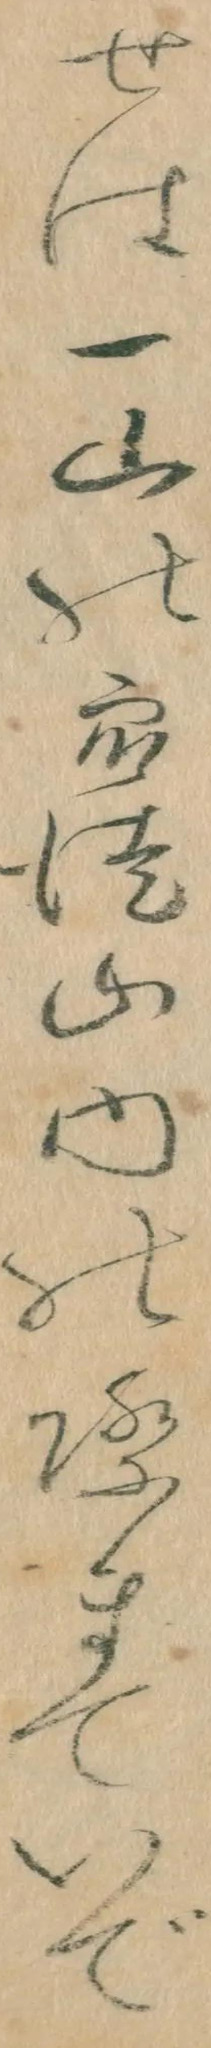せは一山の衆徒山内の際まていで
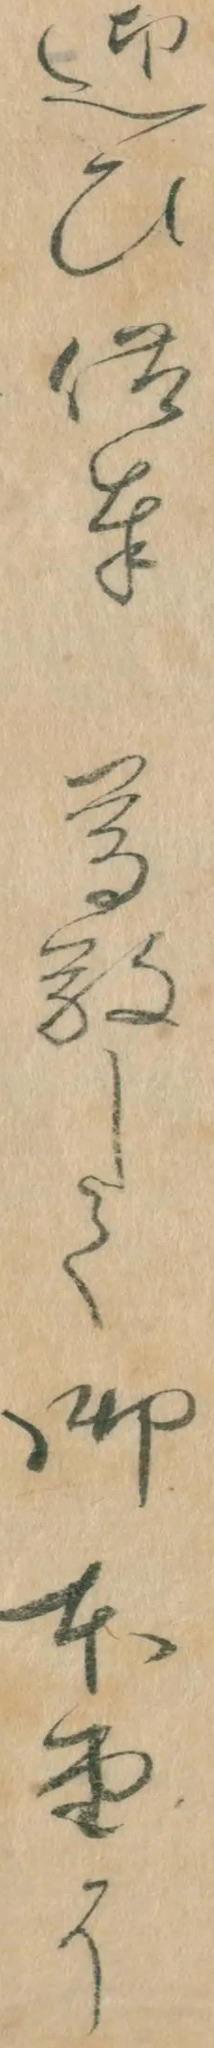迎ひ供奉尊敬して御本堂に
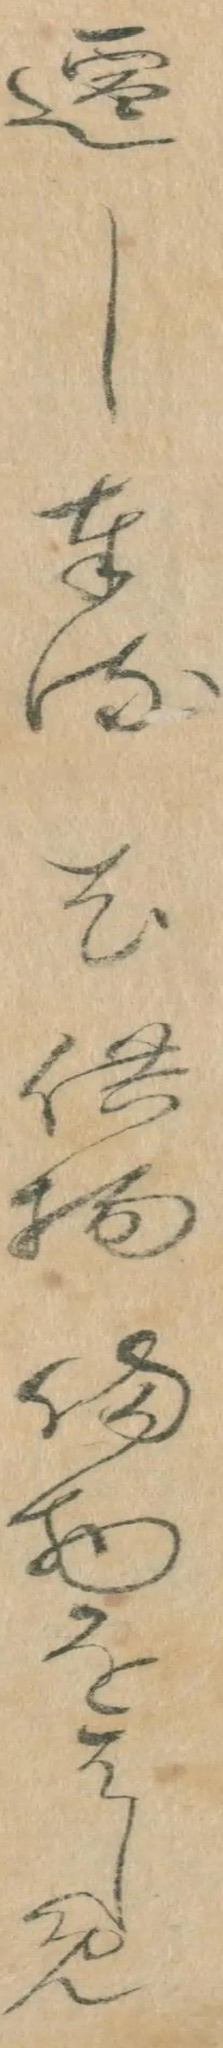遷し奉る花供物備物をはしめ

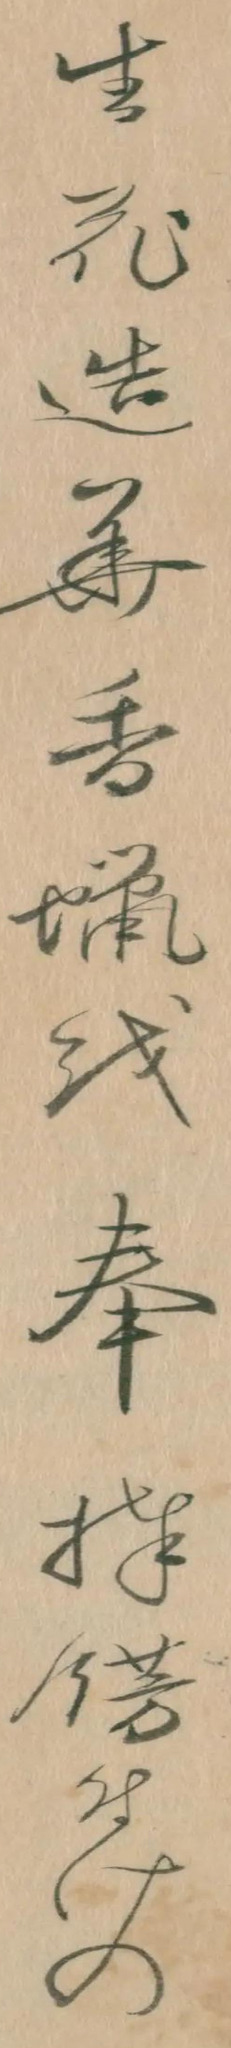生花造華香蝋を奉捧餝付けの
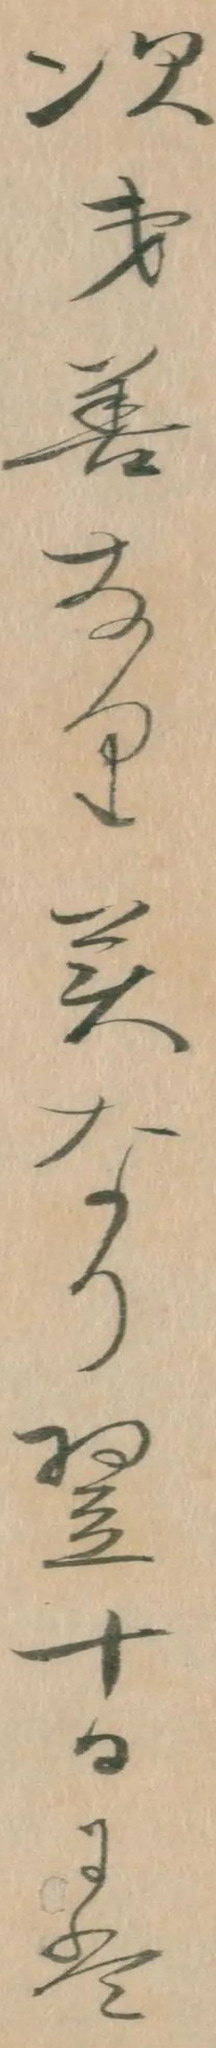次第善なり美なり翌十日には
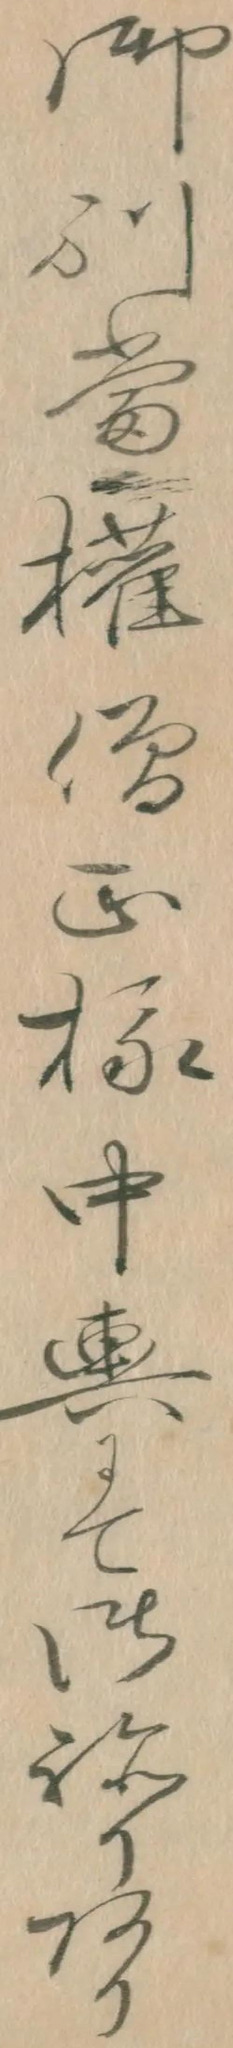御別当權僧正様中輿にて御ねりあり
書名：俗語之種. [2]
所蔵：国立国会図書館 National Diet Library, JAPAN
